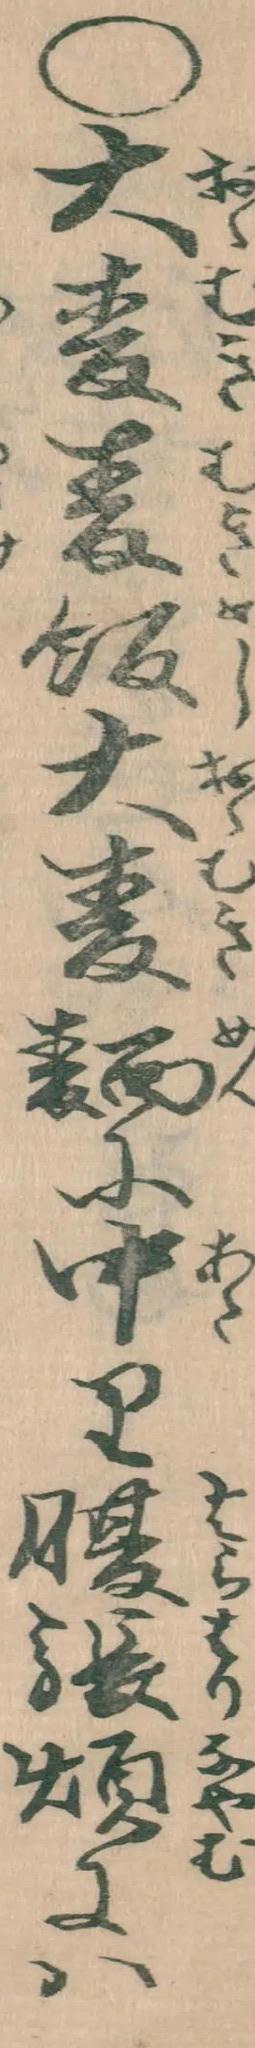〇大麦麦飯大麦麺に中り腹張煩には
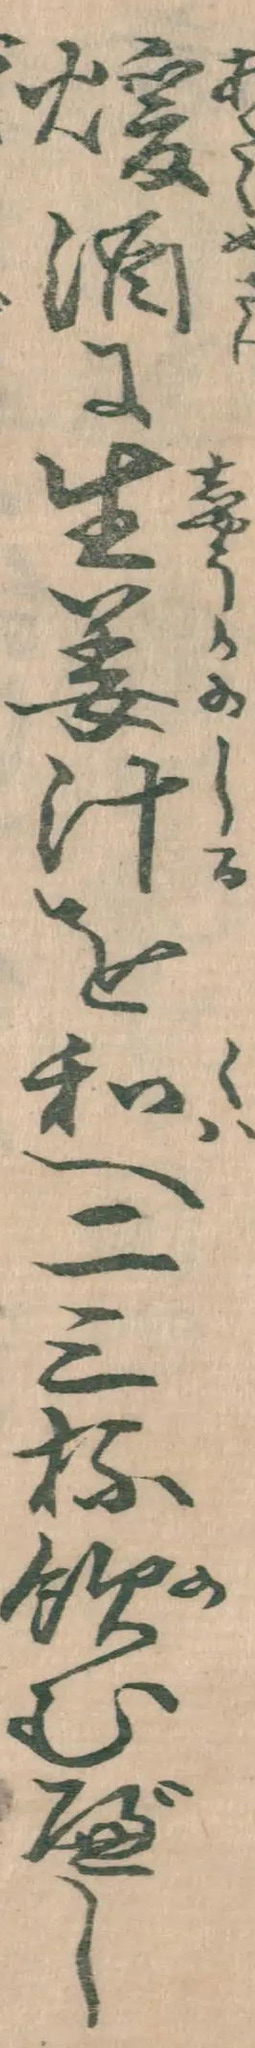煖酒に生姜汁を和へニ三杯飲むべし
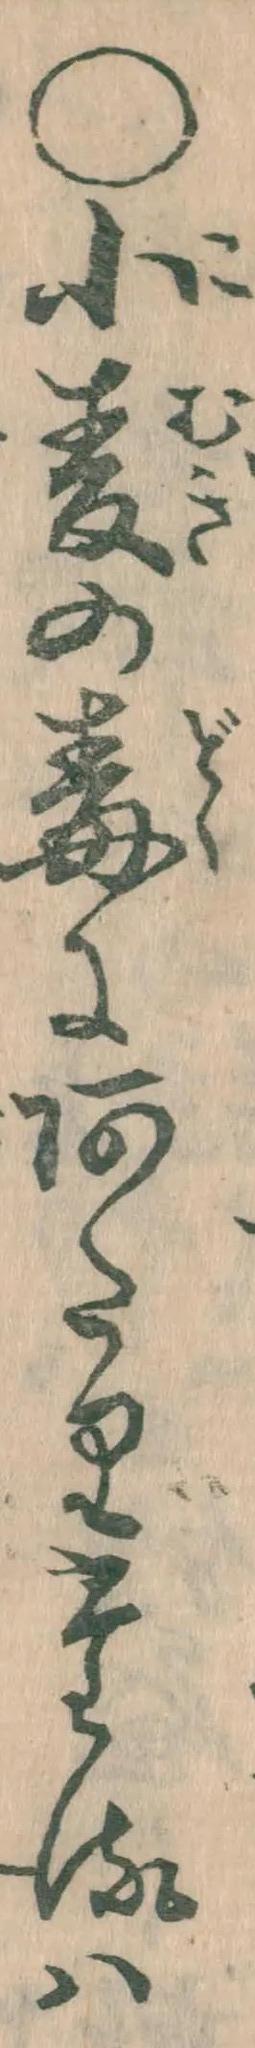〇小麦の毒にあたりたるは
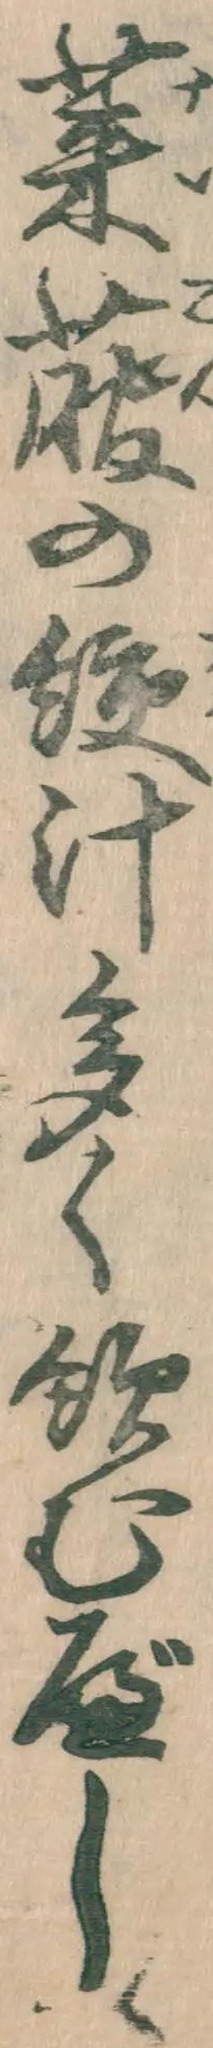菜菔の絞汁多く飲むべし
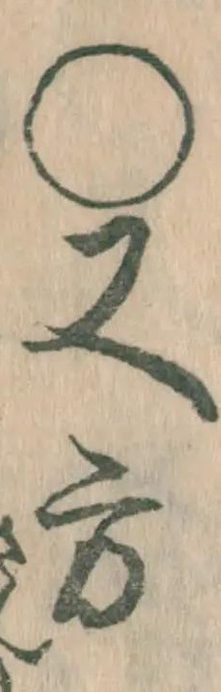〇又方
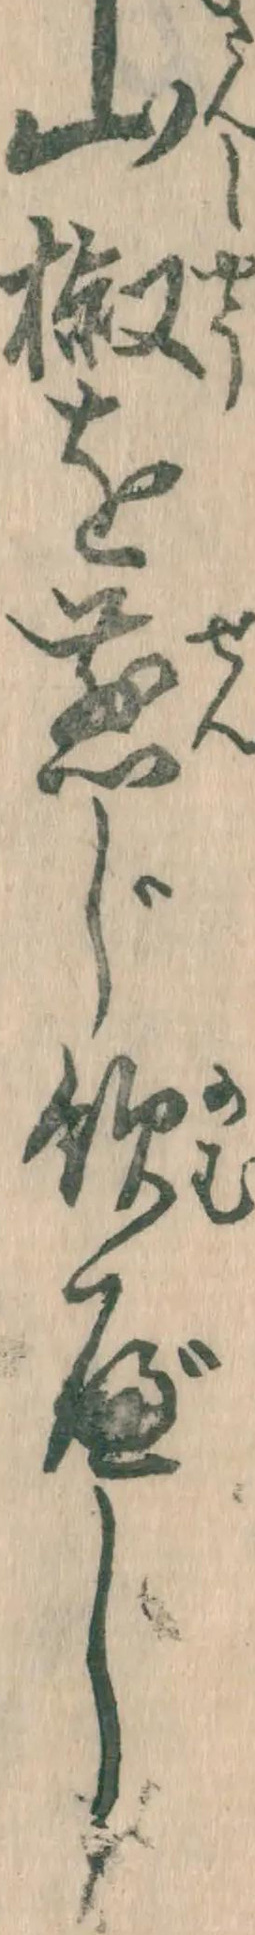山椒を煎じ飲むべし
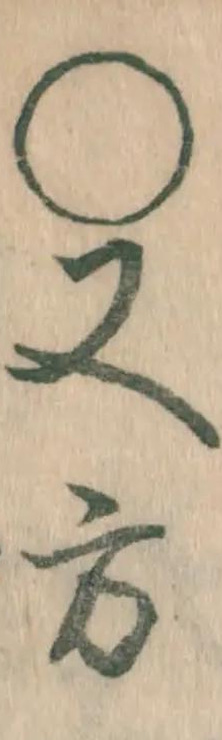〇又方
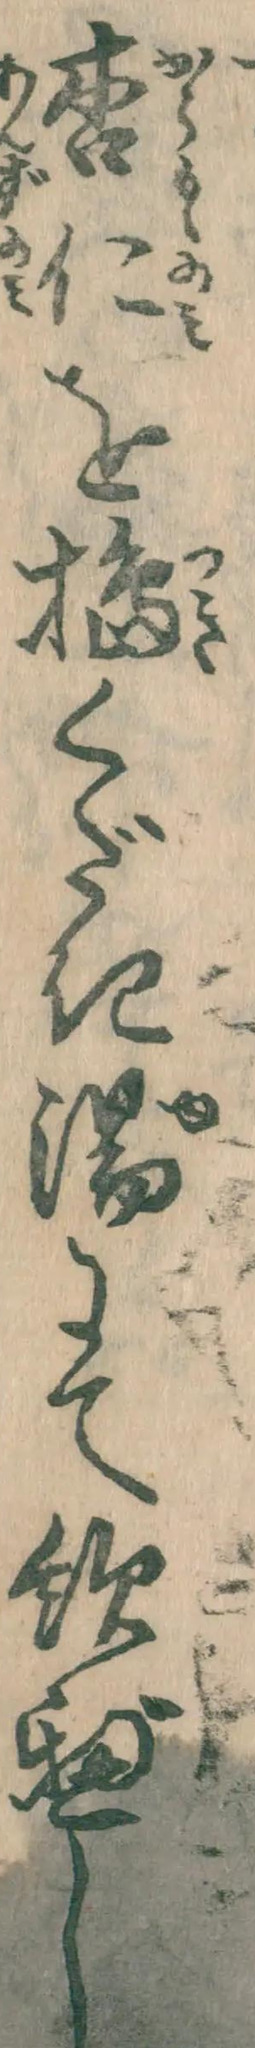杏仁を搗くだき湯にて飲べし

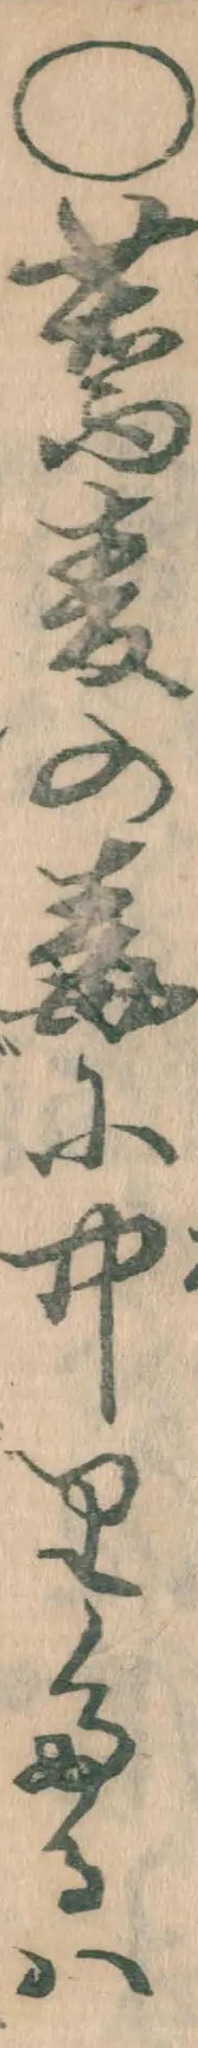〇蕎麦の毒に中りたるは
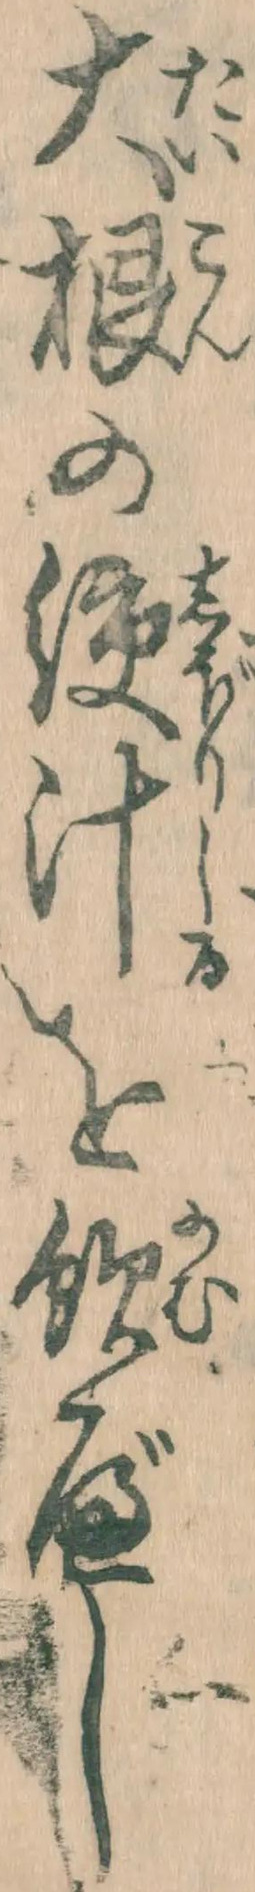大根の絞汁を飲べし
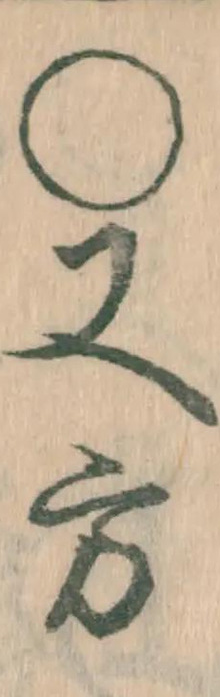〇又方
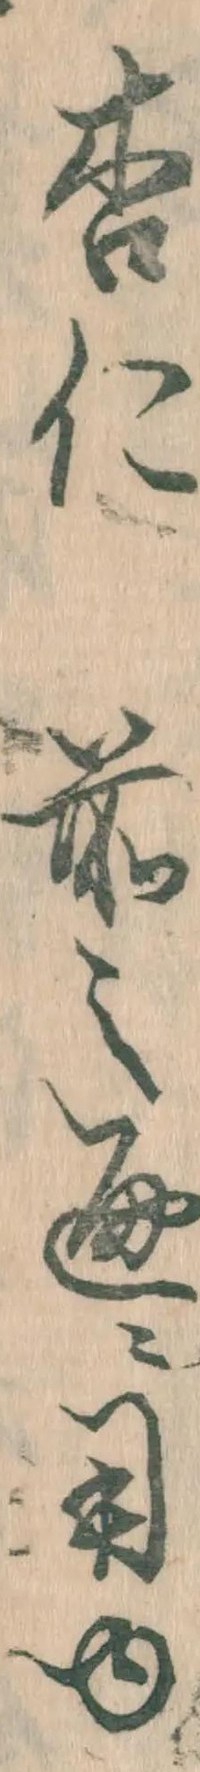杏仁前々通に用ゆ
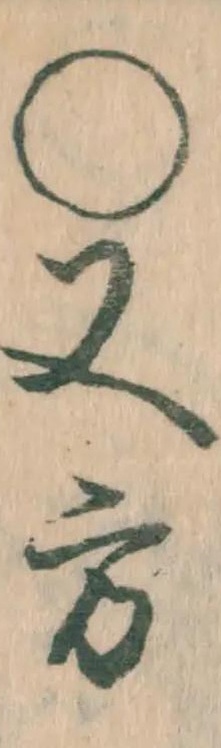〇又方
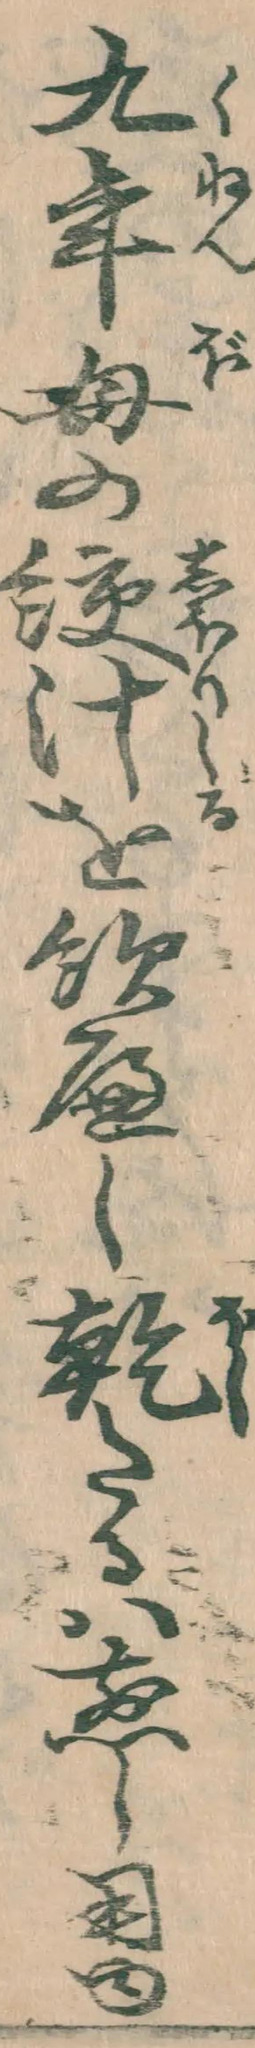九年母の絞汁を飲べし乾たるは煎し用ゆ
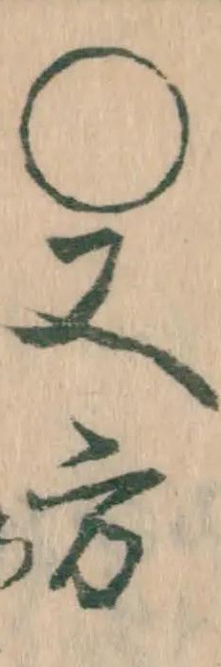〇又方
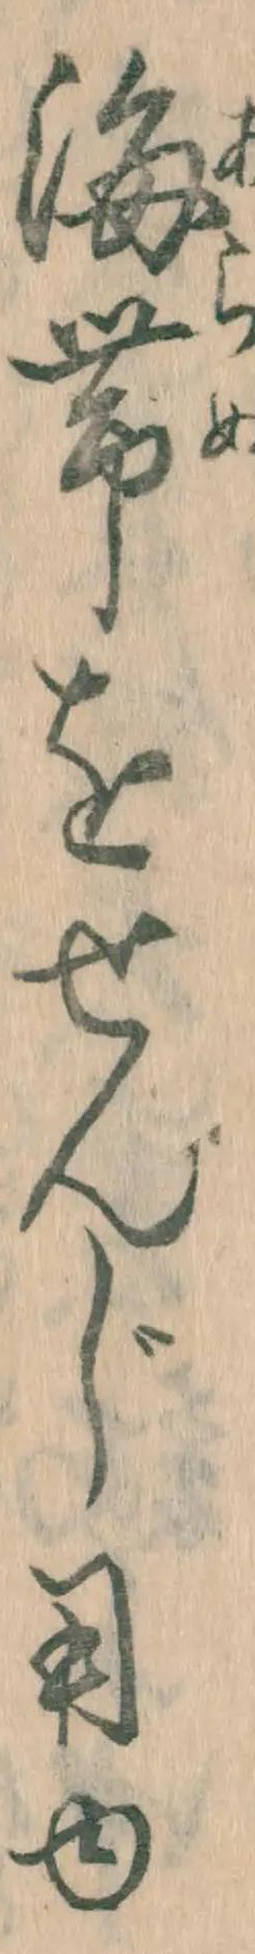海帯をせんじ用ゆ
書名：救荒鄙諭
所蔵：国立国会図書館 National Diet Library, JAPAN
